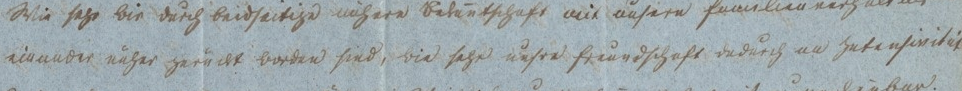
einander näher gerückt worden sind, wie sehr unsre Freundschaft dadurch an Intensivität,
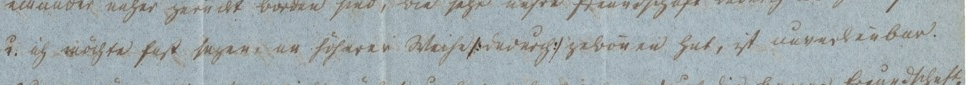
u. ich möchte fast sagen, an höherer Weihe (dadurch) gewonnen hat, ist unverkennbar.
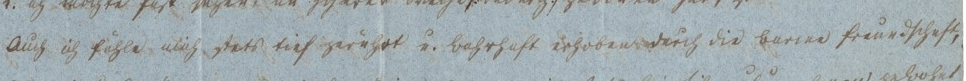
Auch ich fühle mich stets tief gerührt u. wahrhaft erhoben durch die warme Freundschaft,
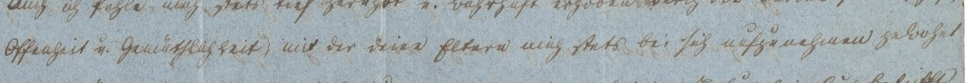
Offenheit u. Gemüthlichkeit, mit der deine Eltern mich stets bei sich aufzunehmen gewohnt
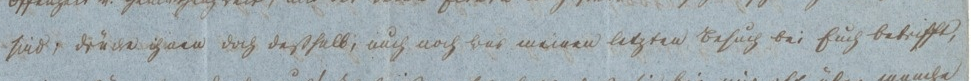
sind, drücke ihnen doch deßhalb, auch noch was meinen letzten Besuch bei Euch betrifft,
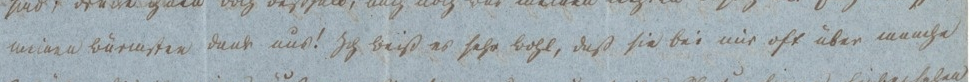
meinen wärmsten Dank aus! Ich weiß es sehr wohl, daß sie bei mir oft über manche
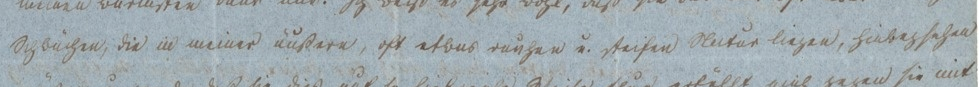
Schwächen, die in meiner äußern, oft etwas rauhen u. steifen Natur liegen, hinwegsehen
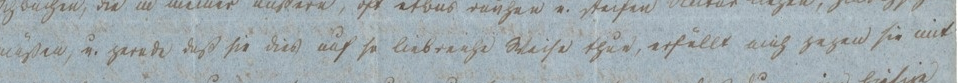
müssen, u. gerade daß sie dies auf so liebreiche Weise thun, erfüllt mich gegen sie mit
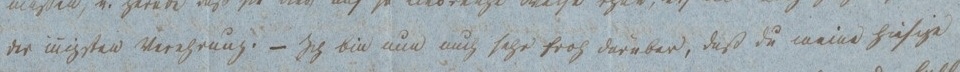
der innigsten Verehrung. – Ich bin nun auch sehr froh darüber, daß du meine hiesige
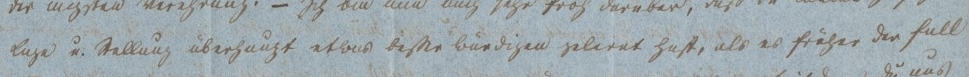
Lage u. Stellung überhaupt etwas besser würdigen gelernt hast, als es früher der Fall
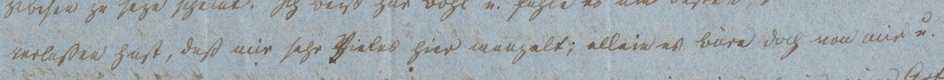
verlassen hast, daß mir sehr Vieles hier mangelt, allein es wäre doch von mir u.
